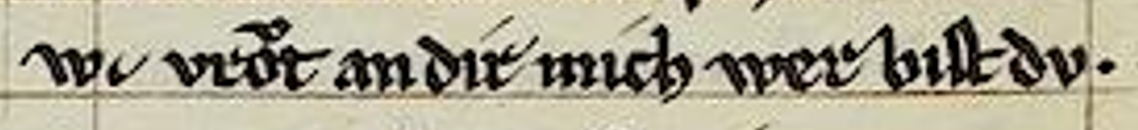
W(az) vro°vt an dir mich wer biſt dv.
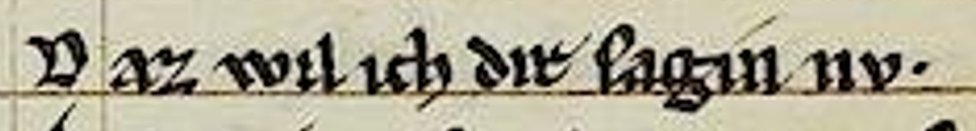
Daz wil ich dir ſagin nv.
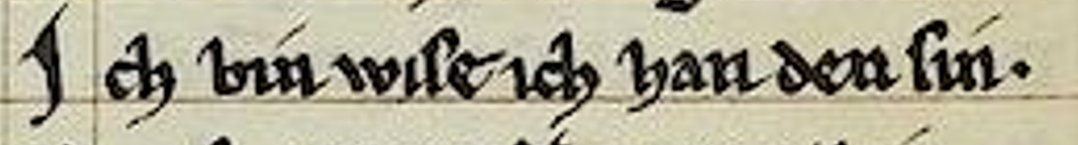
Ich bin wiſe ich han den ſin.
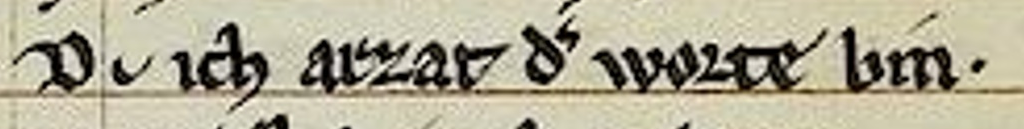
D(az) ich arzat d(er) worte bin.
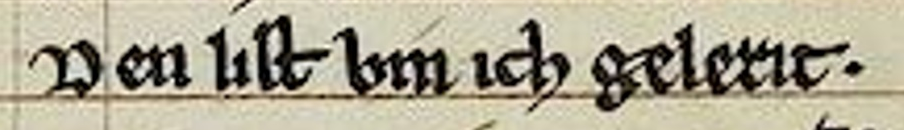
Den liſt bin ich gelerit.
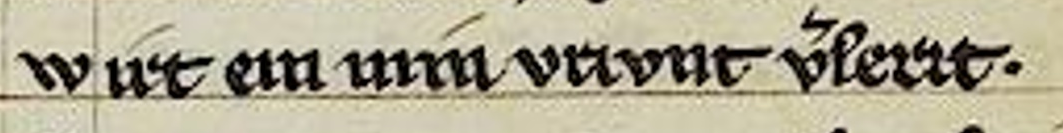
Wirt ein min vrivnt v(er)ſerit.
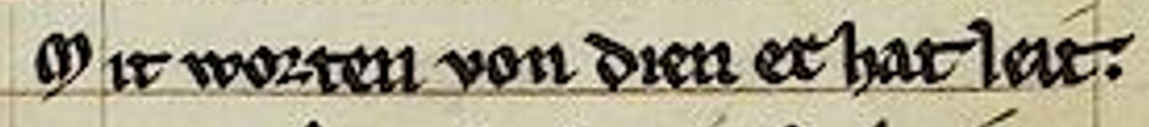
Mit worten von dien er hat leit.
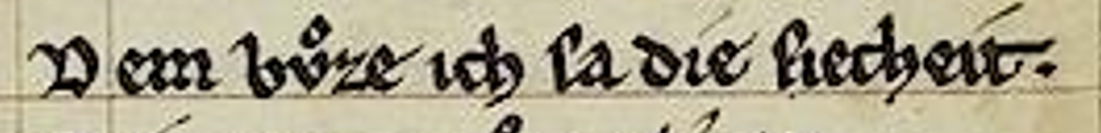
Dem bv°oze ich ſa die ſiecheit.
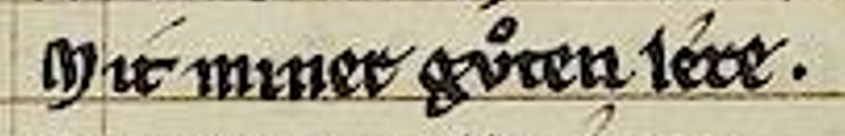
Mit miner gv°oten lere.
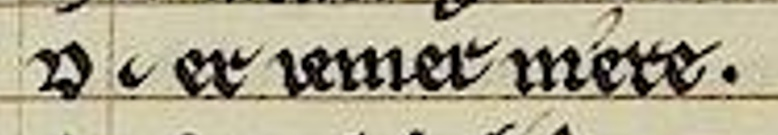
D(az) er iemer mere.
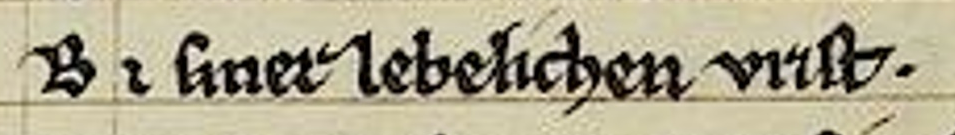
Bi ſiner lebelichen vriſt.
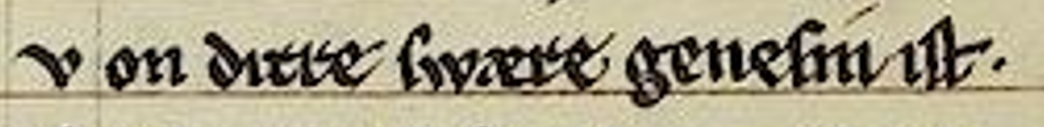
Von dirre ſwaere geneſin iſt.
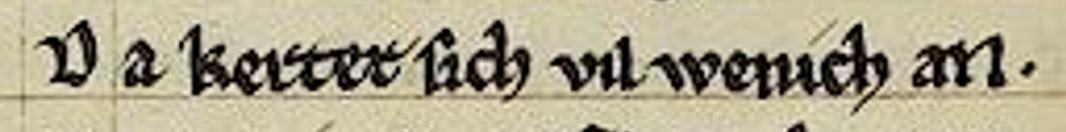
Da kerter ſich vil wenich an.
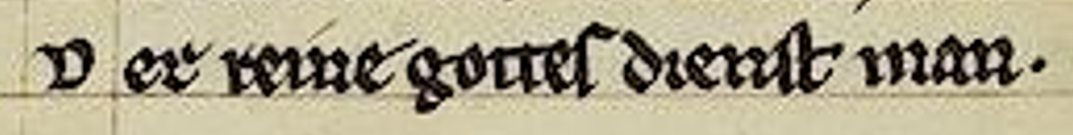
Der reine gotteſ dienſt man.
